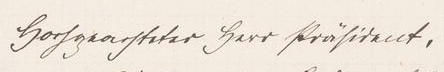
Hochgeachteter Herr Präsident,
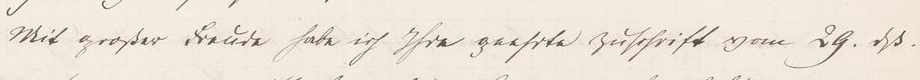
Mit großer Freude habe ich Ihre geehrte Zuschrift vom 29. dß.
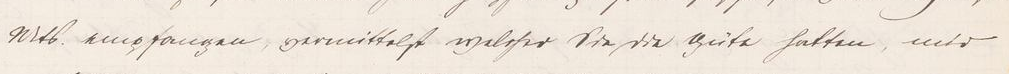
Mts. empfangen, vermittelst welcher Sie die Güte hatten, mir
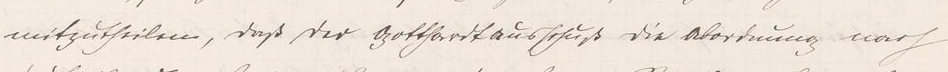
mitzutheilen, daß der Gotthardausschuß die Abordnung nach
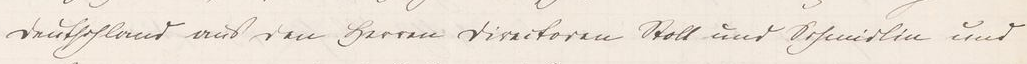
Deutschland aus den Herren Directoren Stoll und Schmidlin und
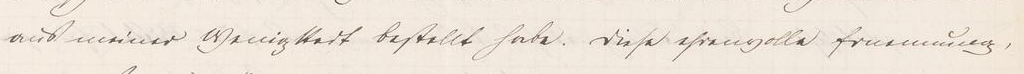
aus meiner Wenigkeit bestellt habe. Diese ehrenvolle Ernennung,
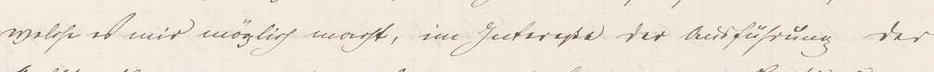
welche es mir möglich macht, im Intereße der Ausführung der
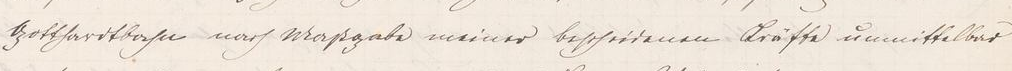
Gotthardtbahn nach Maßgabe meiner bescheidenen Kräfte unmittelbar
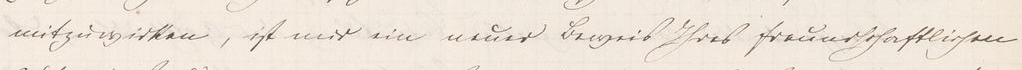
mitzuwirken, ist mir ein neuer Beweis Ihres freundschaftlichen
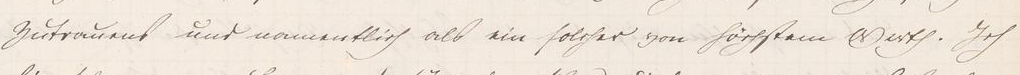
Zutrauens und namentlich als ein solcher von höchstem Werth. Ich
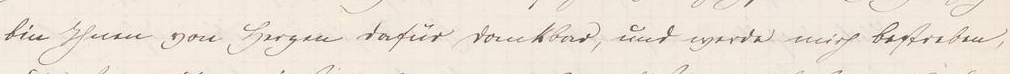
bin Ihnen von Herzen dafür dankbar, und werde mich bestreben,
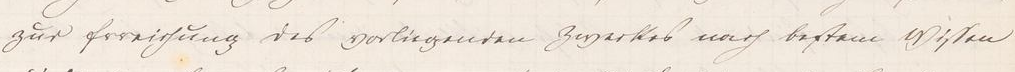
zur Erreichung des vorliegenden Zweckes nach bestem Wissen
